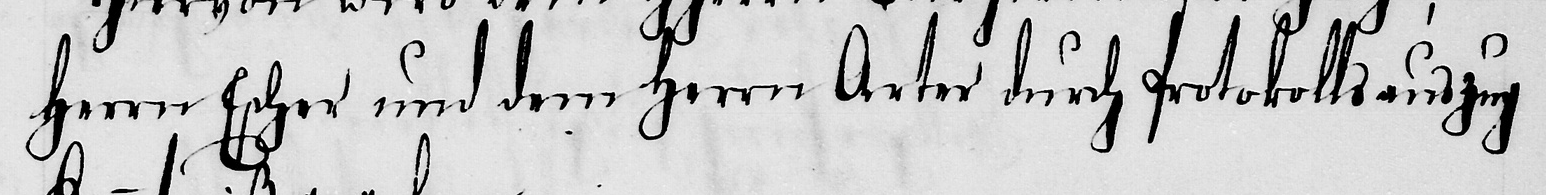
Herrn Escher und dem Herrn Artur durch Protokollsauszug
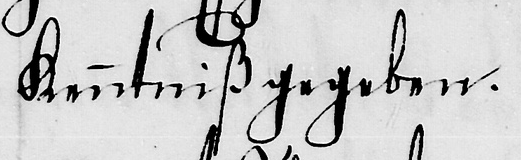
Kenntniß gegeben.
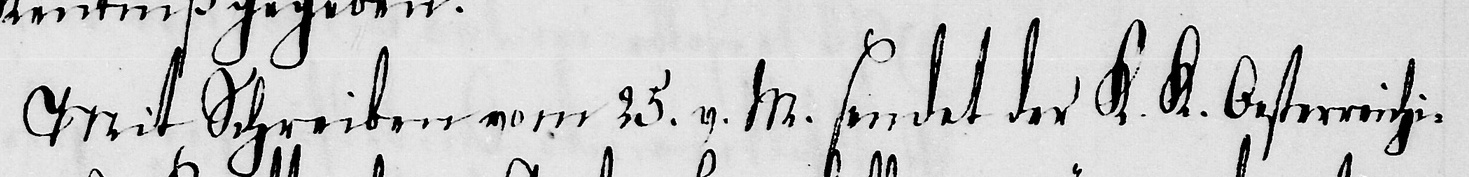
Mit Schreiben vom 25. v. M. sendet der K. K. Oesterrei¬
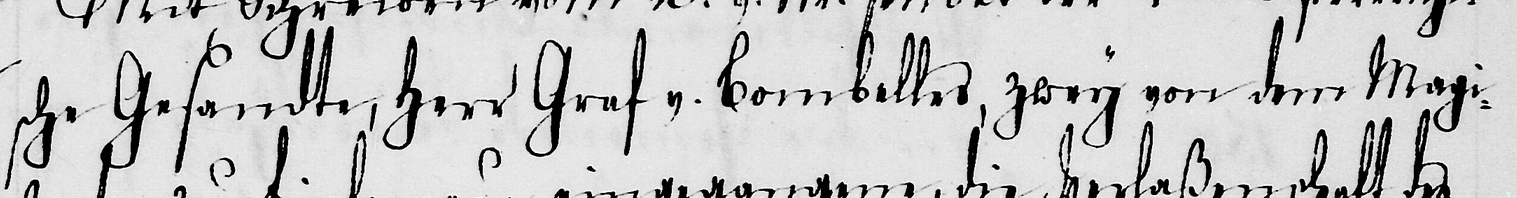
sche Gesandte, Herr Graf v. Bombelles, zwey von dem Magi¬
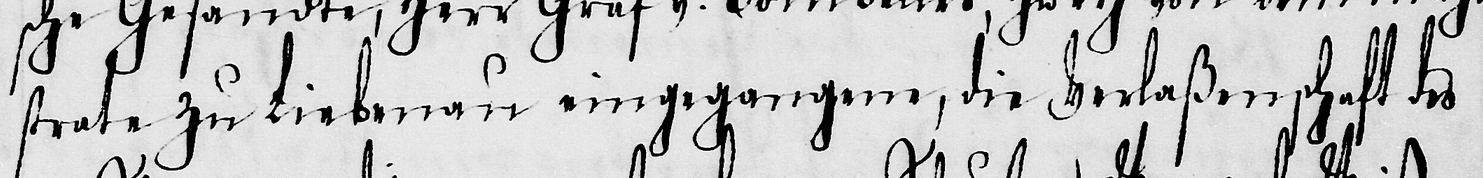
strate zu Liebenau eingegangene, die Verlaßenschaft des
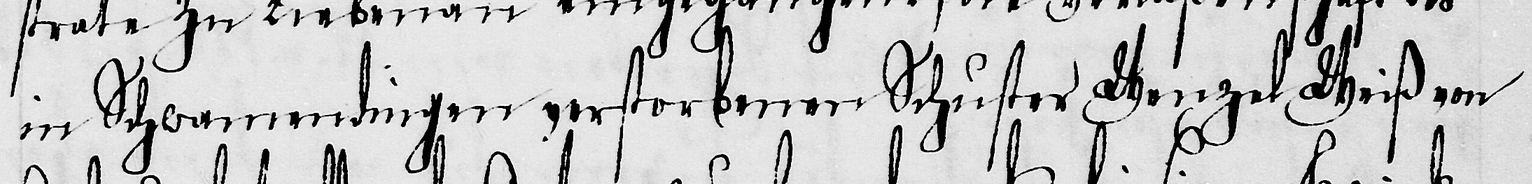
in Schwamendingen verstorbenen Schuster Wenzel Weiß von
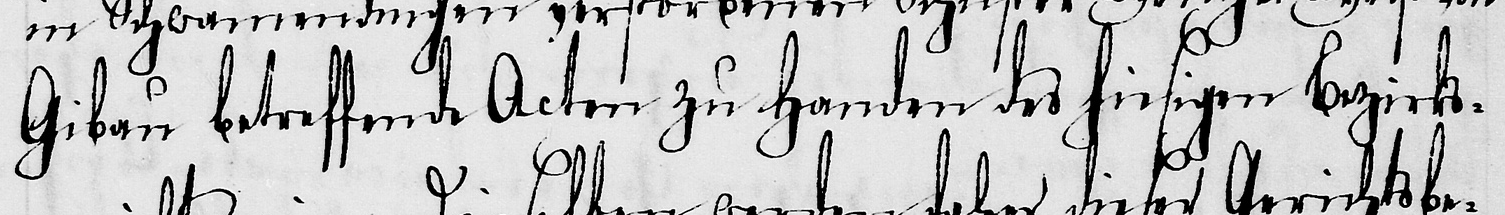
Gibau betreffende Acten zu Handen des hiesigen Bezirks¬
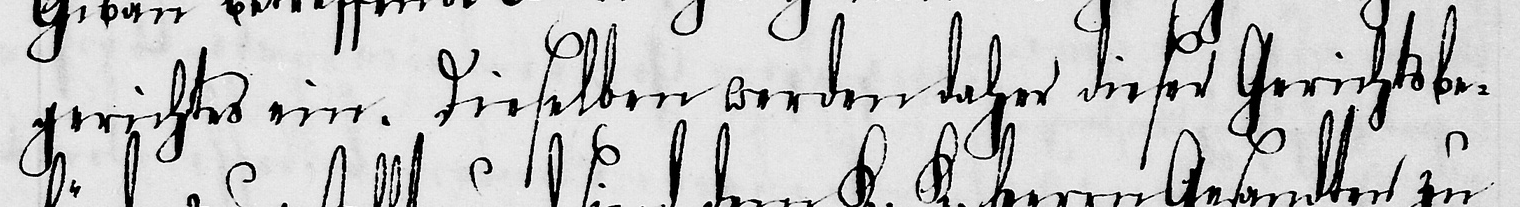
gerichtes ein. Dieselben werden daher dieser Gerichtsbe¬
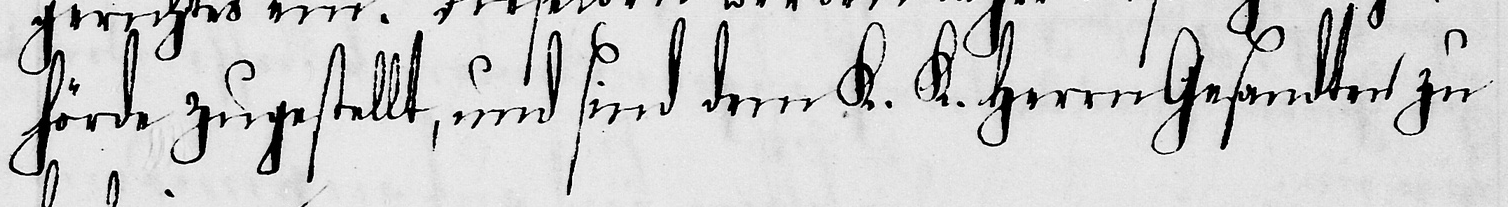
hörde zugestellt, und sind dem K. K. Herrn Gesandten zu
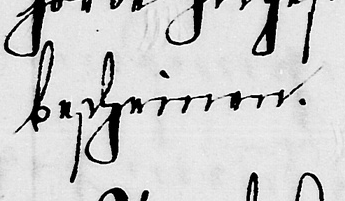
bescheinen.
